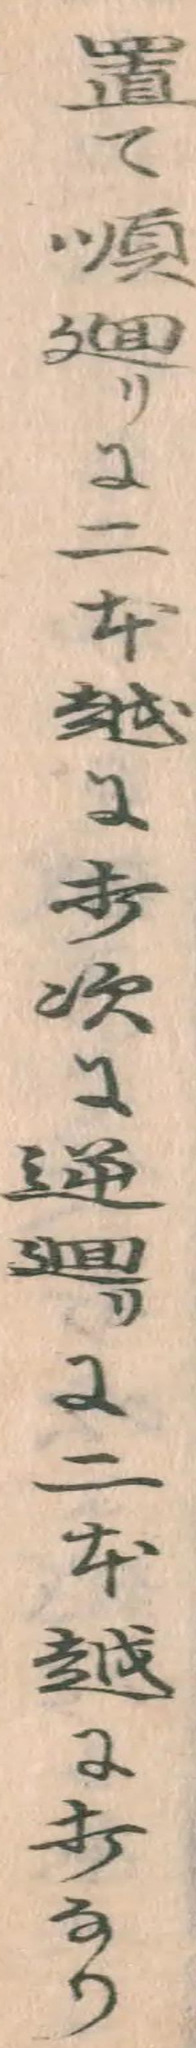置て順廻りに二本越に打次に逆廻りに二本越に打なり
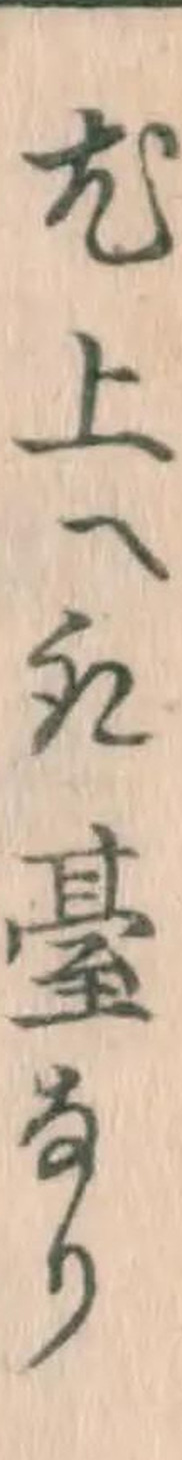尤上へ取台なり
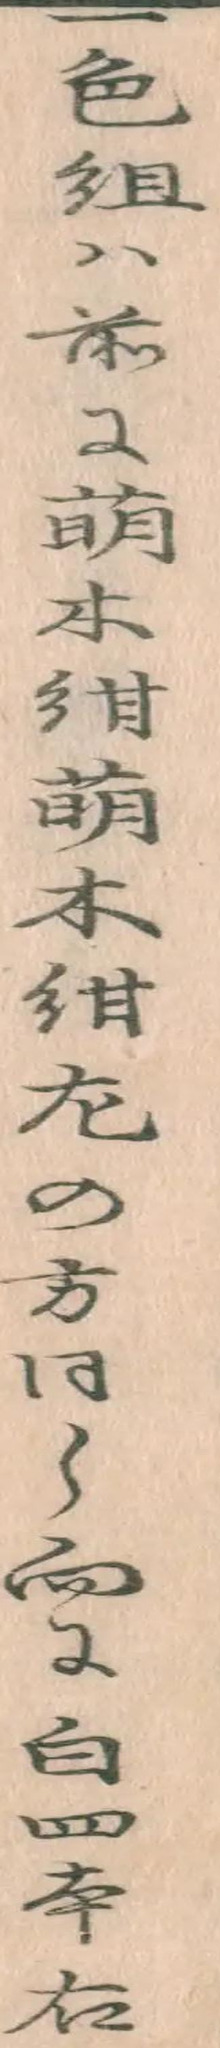一色組は前に萌木紺萌木紺左の方同し向に白四本右
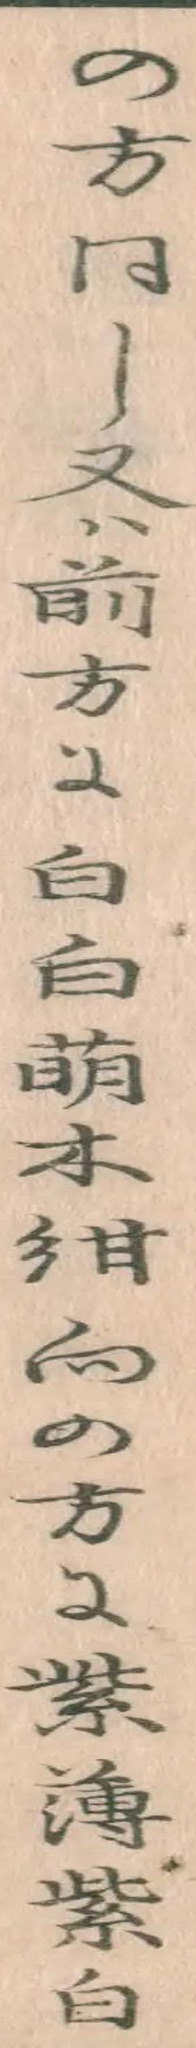の方同し又は前方に白白萌木紺向の方に紫薄紫白
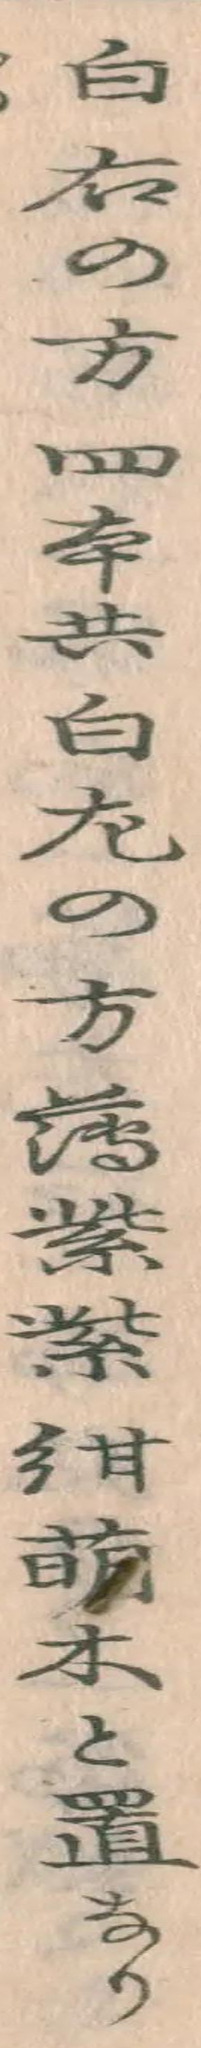白右の方四本共白左の方薄紫紫紺萌木と置なり
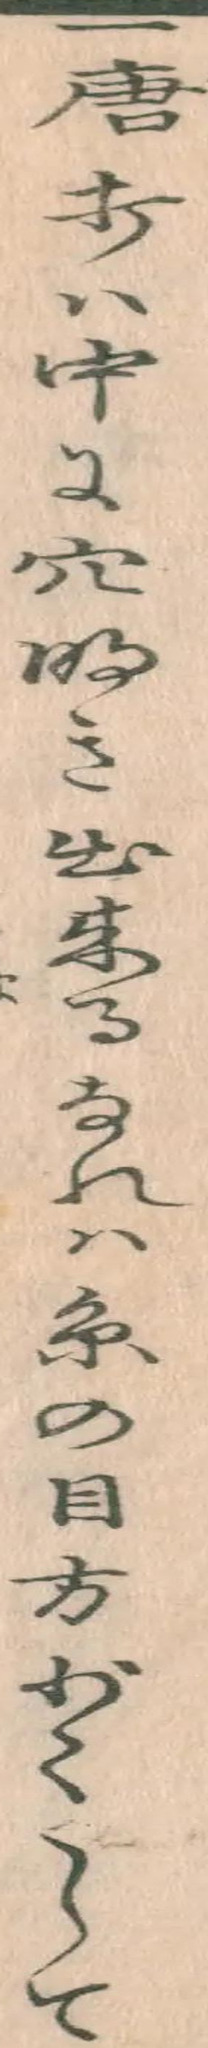一唐打は中に穴明き出来るなれは糸の目方少くして
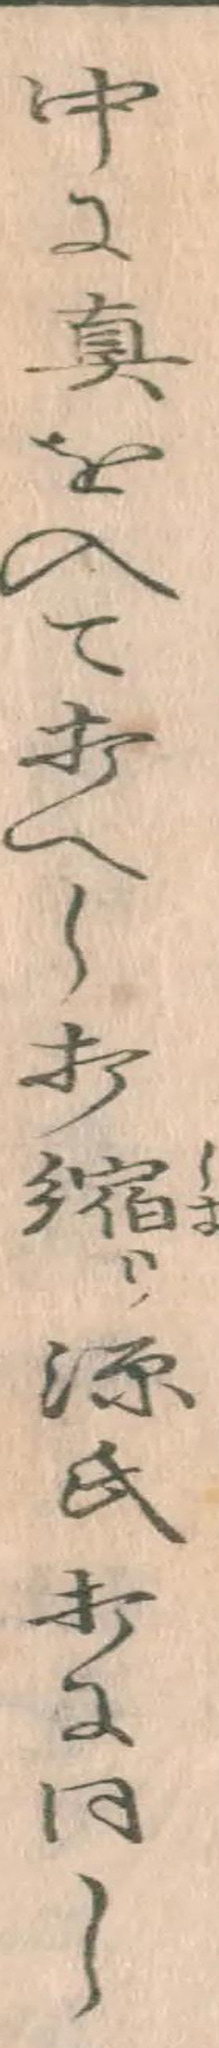中に真を入て打へし打縮り源氏打に同し
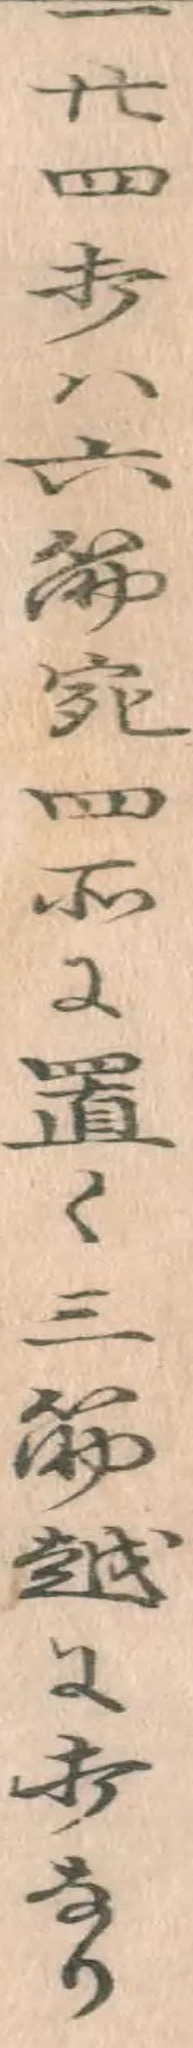一廿四打は六筋宛四所に置く三筋越に打なり
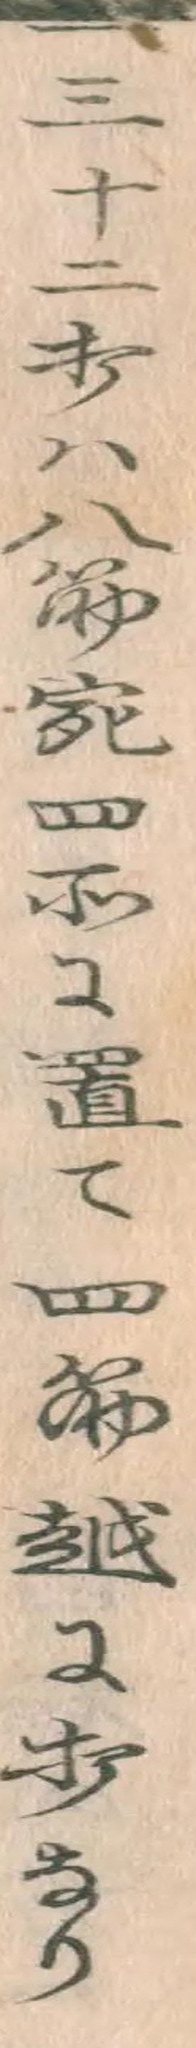一三十二打は八筋宛四所に置て四筋越に打なり
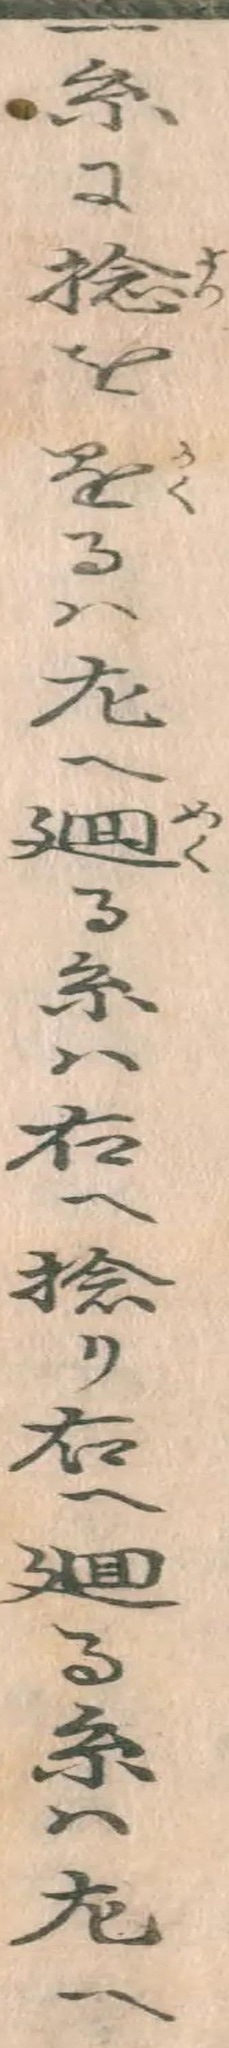一糸に捻を懸るは左へ廻る糸は右へ捻り右へ廻る糸は左へ
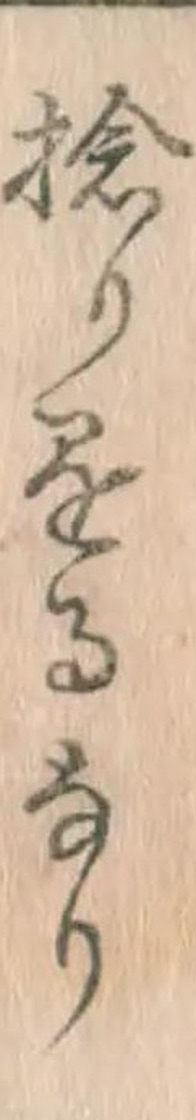捻り懸るなり
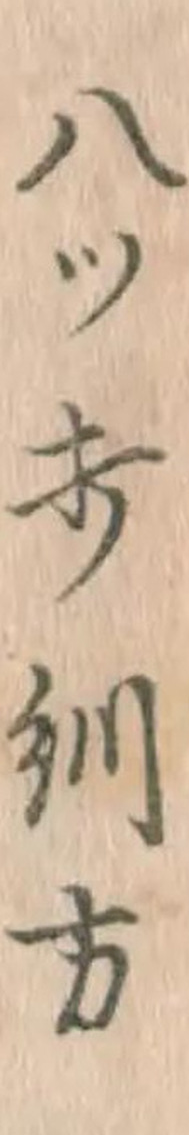八ッ打紃方
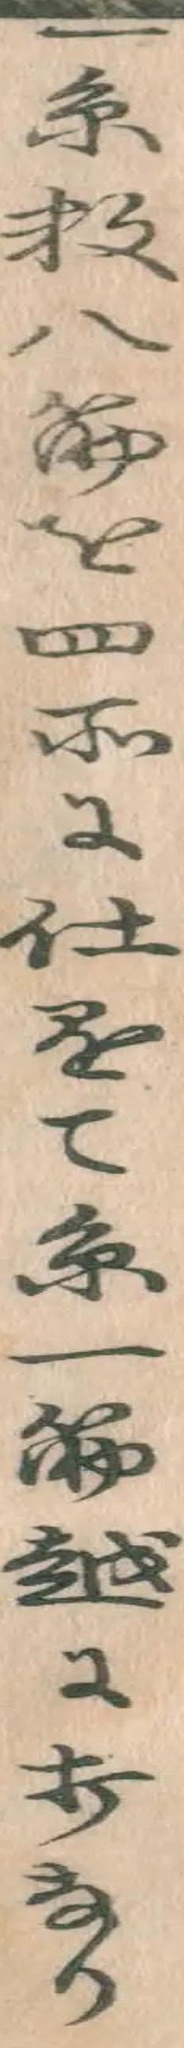一糸数八筋を四所に仕懸て糸一筋越に打なり

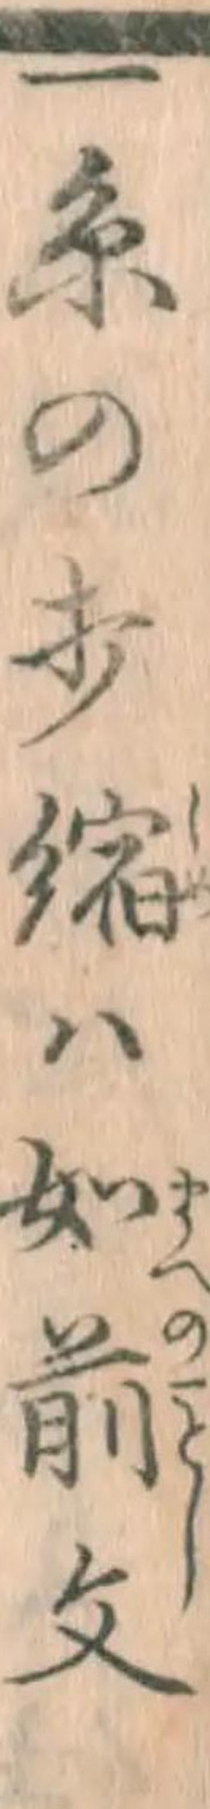一糸の打縮は如前文
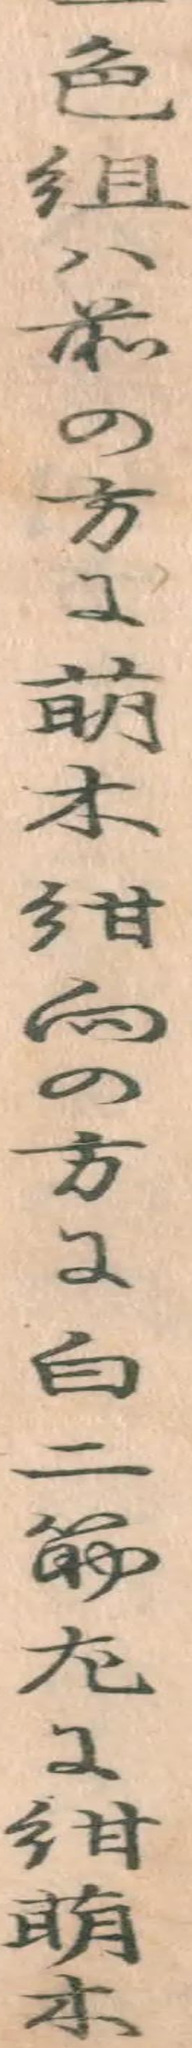一色組は前の方に萌木紺向の方に白二筋左に紺萌木
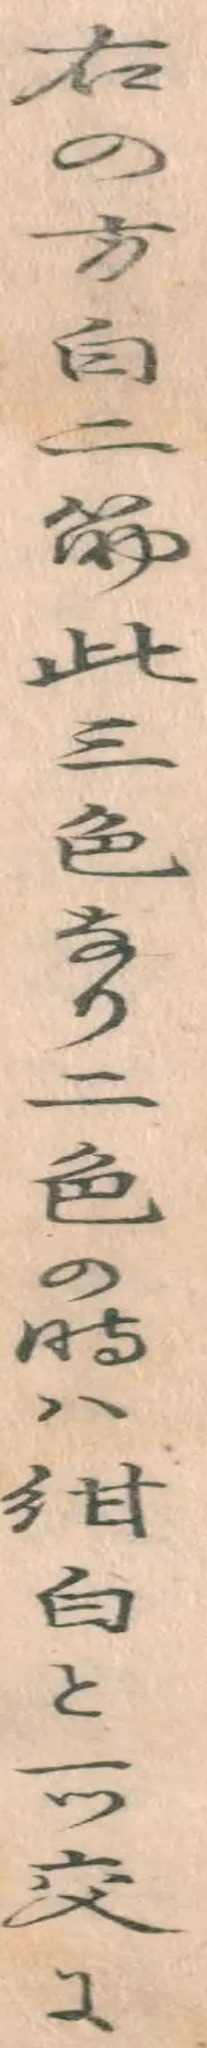右の方白二筋此三色なり二色の時は紺白と一ッ交に
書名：機織彙編 5巻. [2]
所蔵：国立国会図書館 National Diet Library, JAPAN
